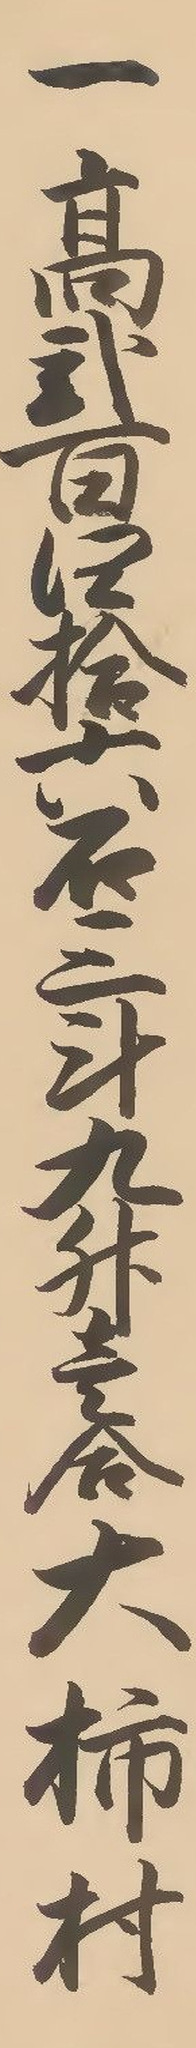一髙弐百四拾六石三斗九升壱合大柿村
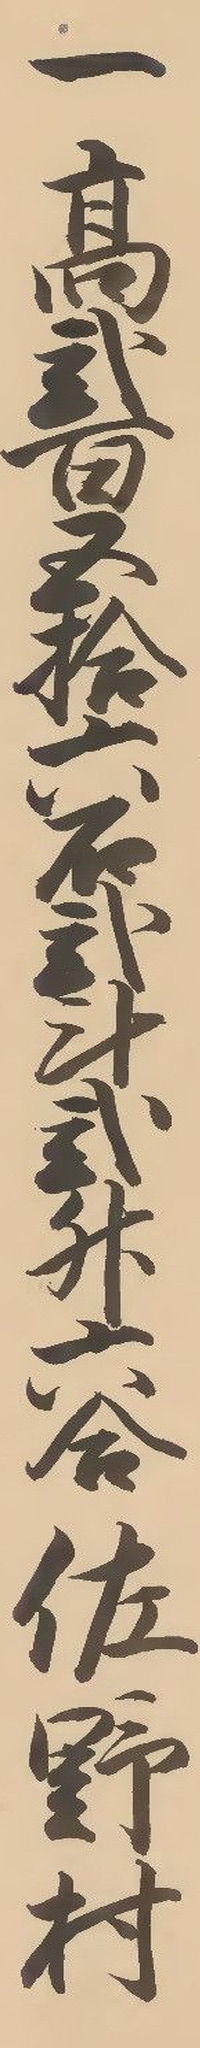一髙弐百五拾六石弐斗弐升六合佐野村
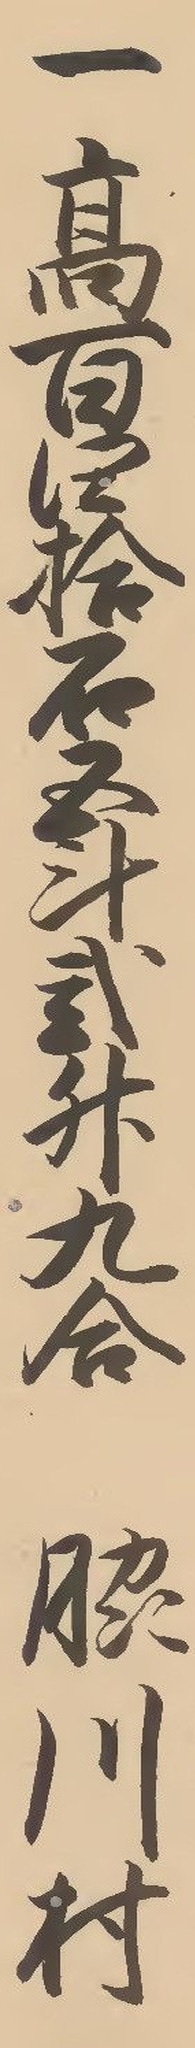一髙百四拾石五斗弐升九合脇川村

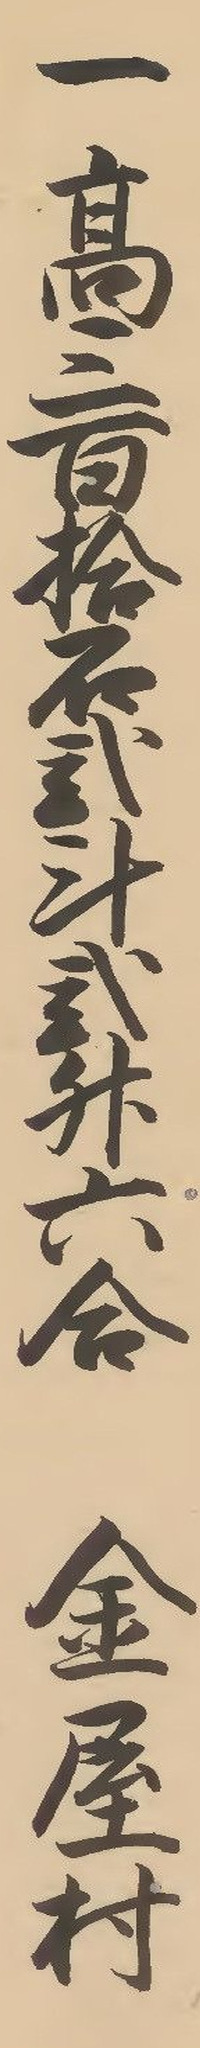一髙三百拾石弐斗弐升六合金屋村
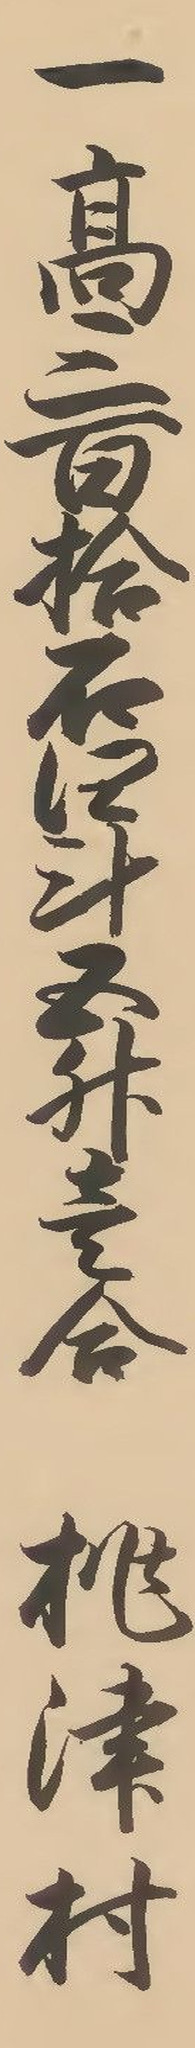一髙三百拾石四斗五升壱合桃津村
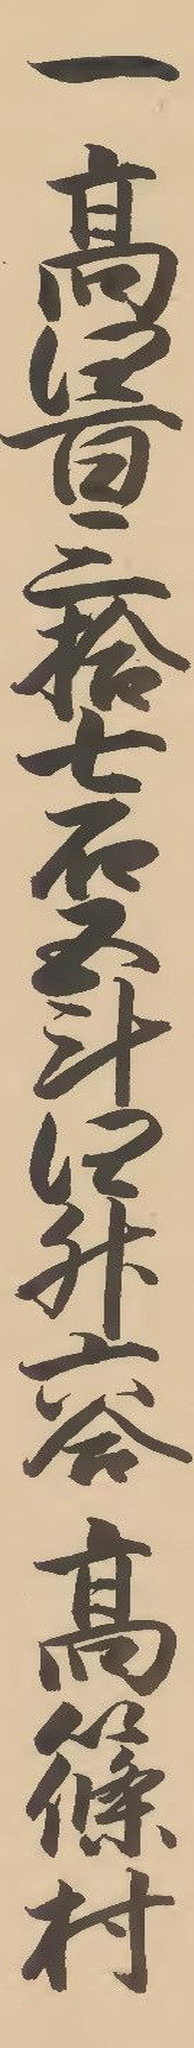一髙四百三拾七石五斗四升六合髙篠村
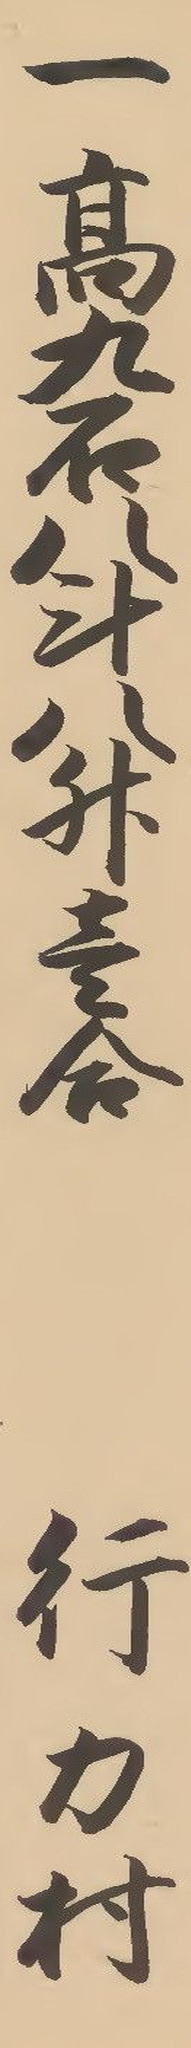一髙九石八斗八升壱合行力村
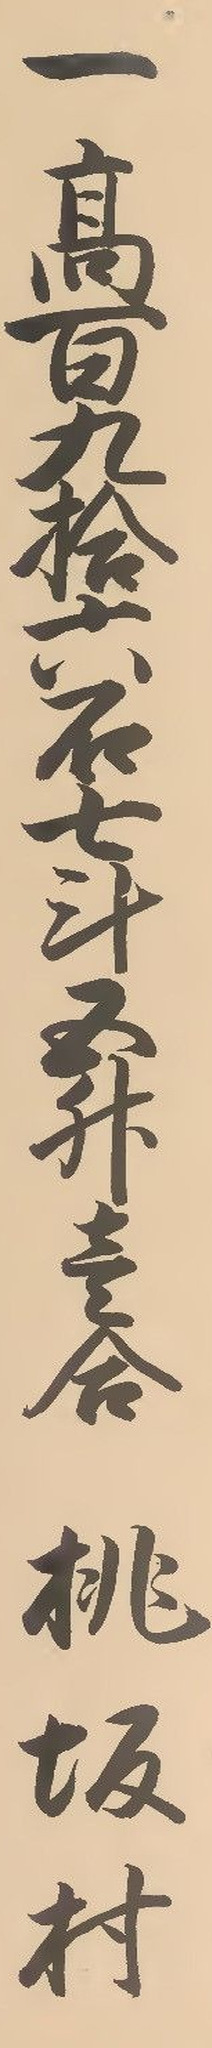一髙百九拾六石七斗五升壱合桃坂村
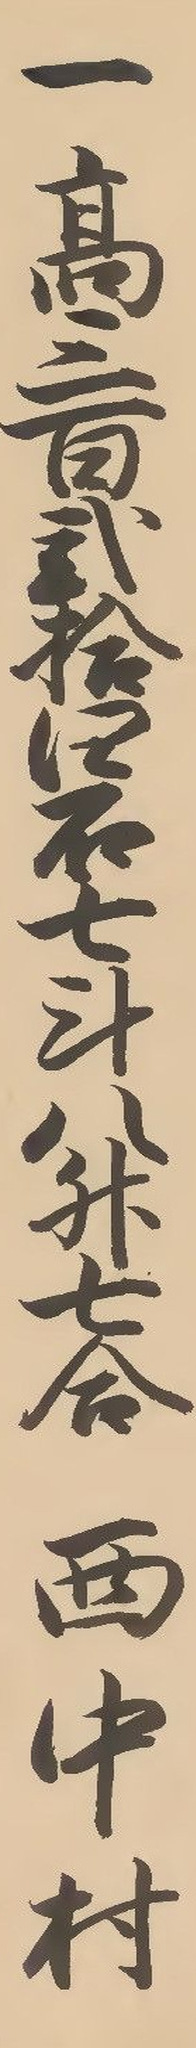一髙三百弐拾四石七斗八升七合西中村
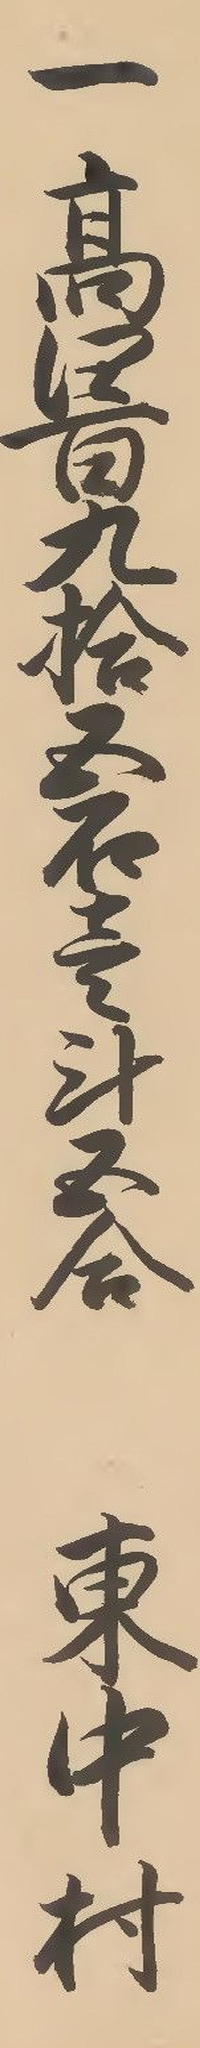一髙四百九拾五石壱斗五合東中村
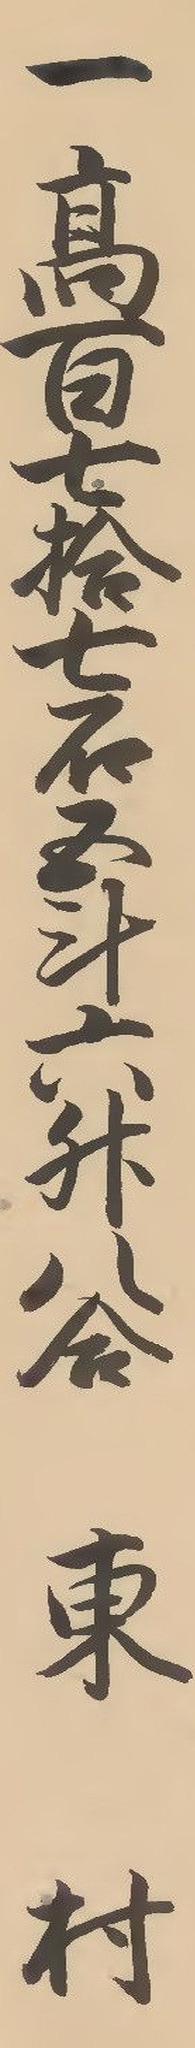一髙百七拾七石五斗六升八合東村

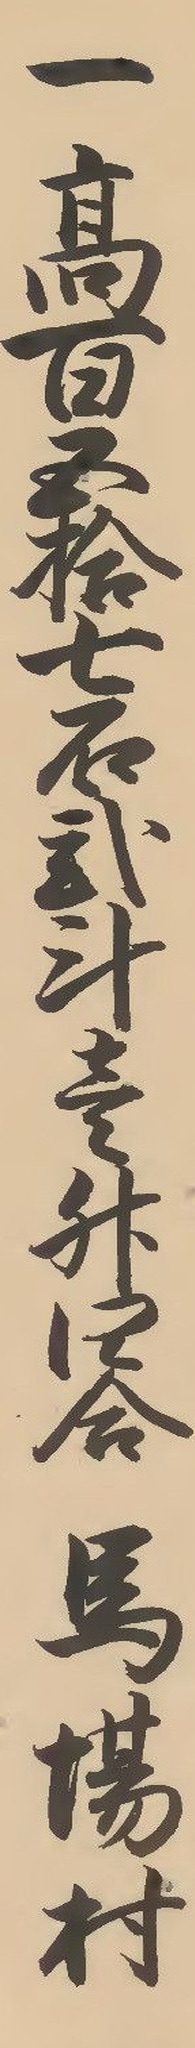一髙百五拾七石弐斗壱升四合馬場村
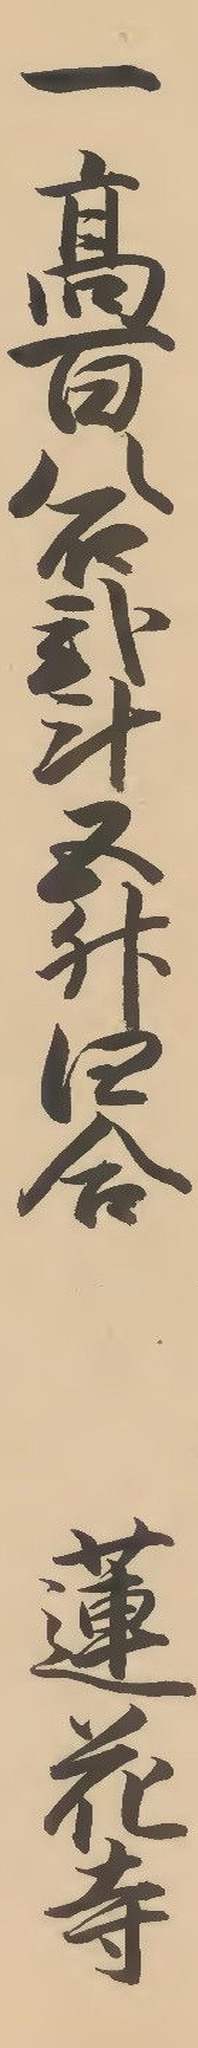一髙百八石弐斗五升四合蓮花寺
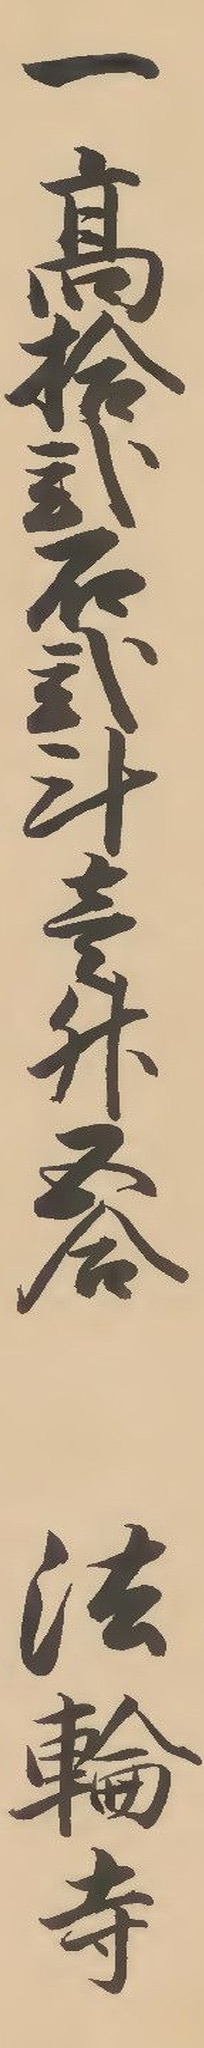一髙拾弐石弐斗壱升五合法輪寺
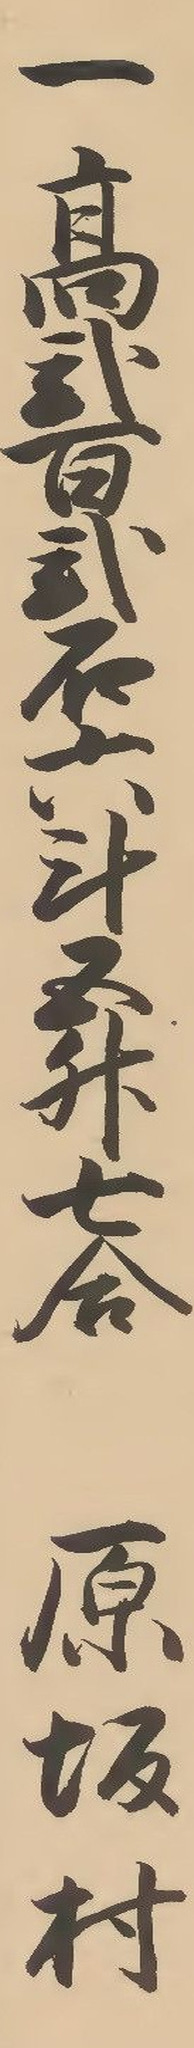一髙弐百弐石六斗五升七合原坂村
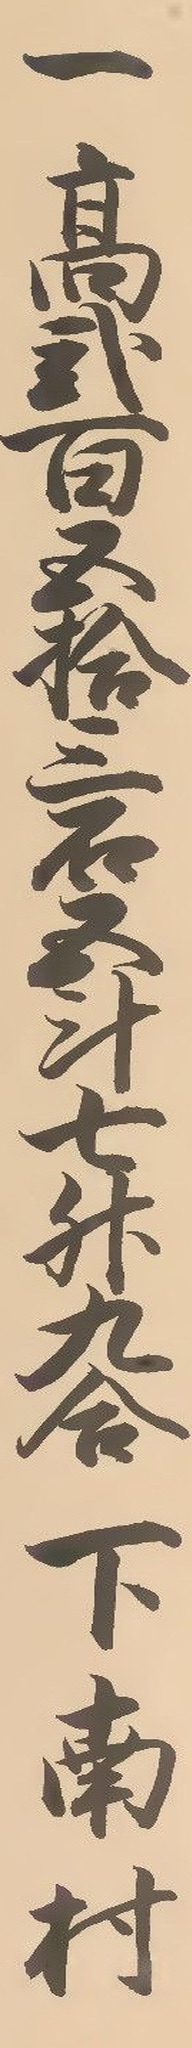一髙弐百五拾三石五斗七升九合下南村
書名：播磨国郷帳
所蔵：国立公文書館 National Archives of Japan
